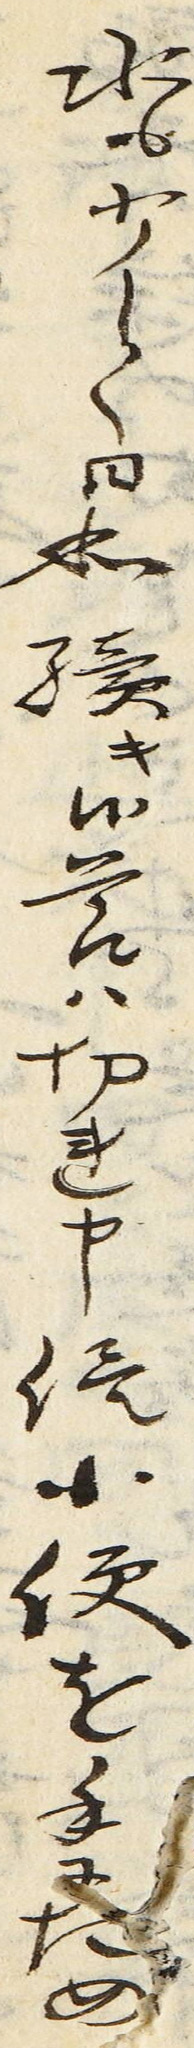水も少しく日和続き候節は切れ申侭小便を手にため
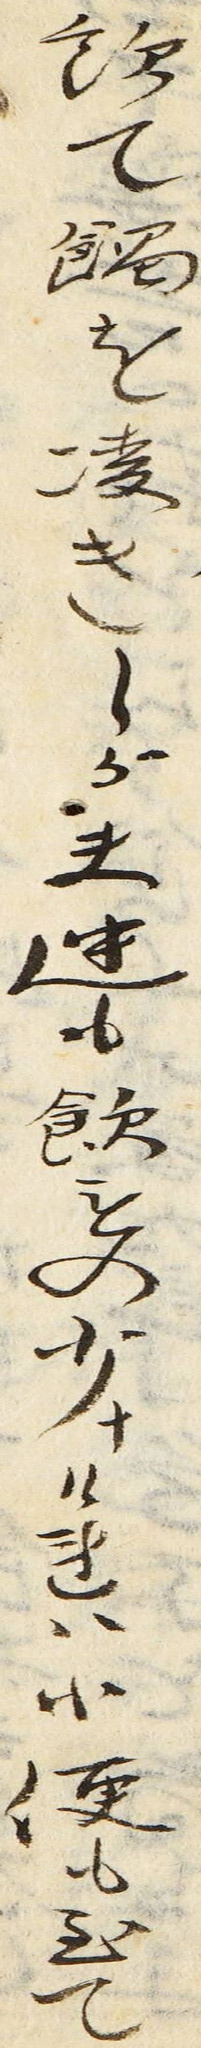飲てを凌きしが夫迚も飲もの少なるれは小便も至て
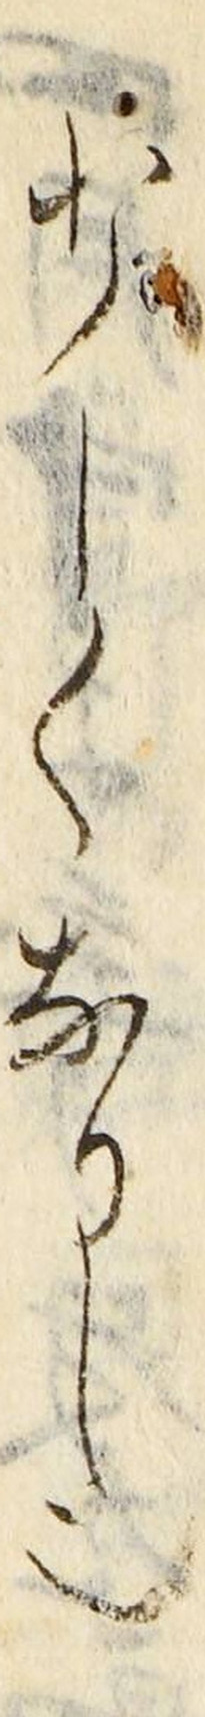少しくなりし也
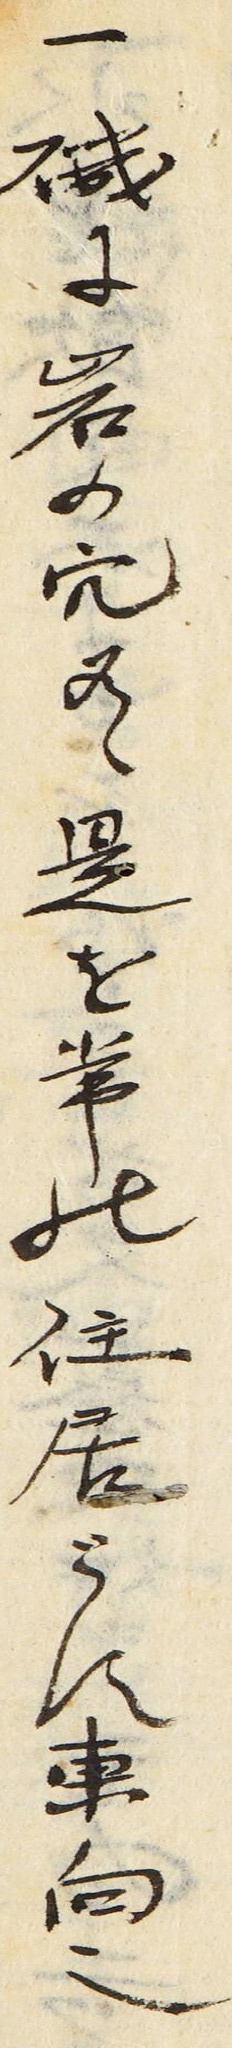一磯に岩の穴有是を常の住居とす東向也
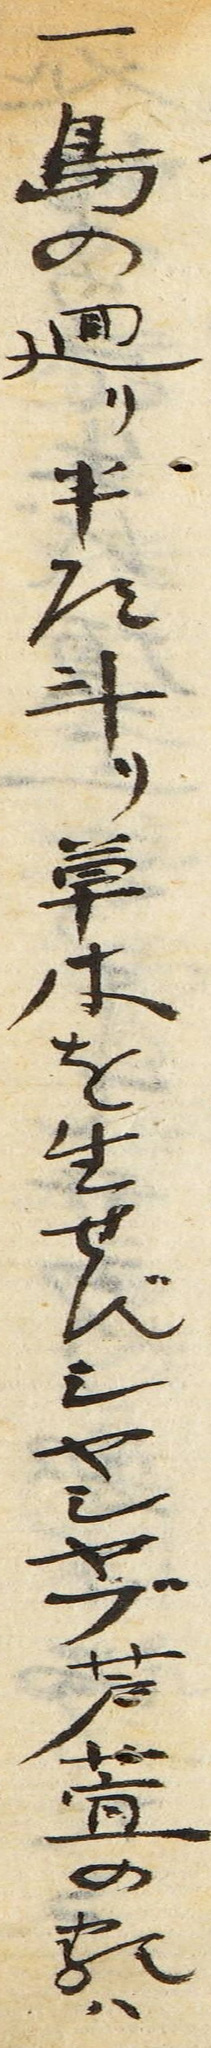一島の廻り半道計り草木を生せずシヤシヤブ芦萱の類は
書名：宇佐浦より漂流留
